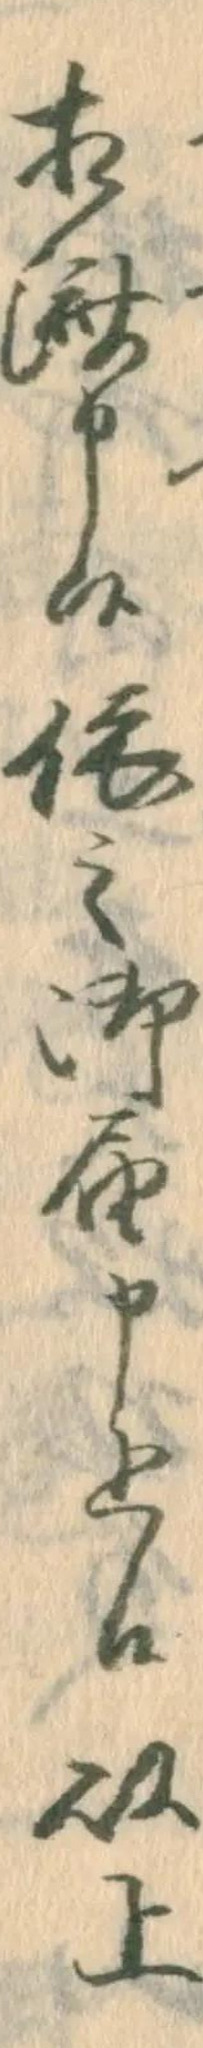相済申候依之御届申上候以上
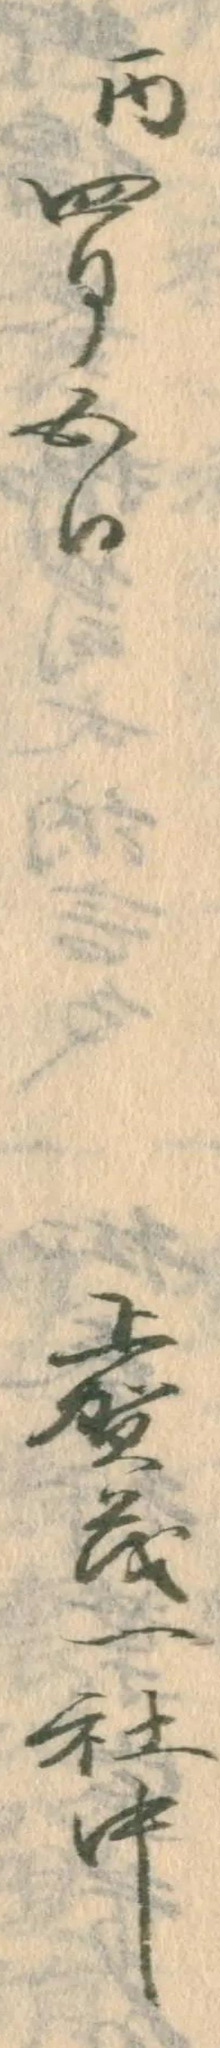酉四月五日上賀茂一社中
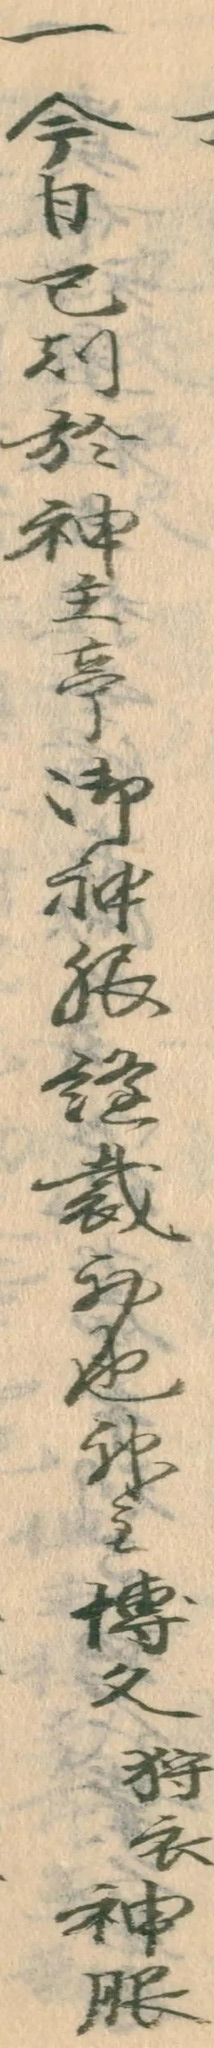一今日巳刻於神主亭御神服縫裁初也神主博久狩衣神服
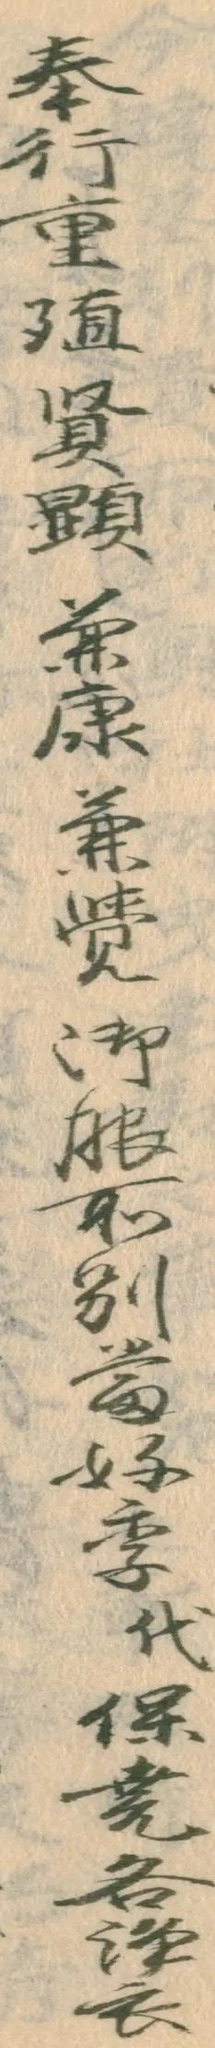奉行重殖賢顕兼康兼覚御服所別当好季代保尭各浄衣
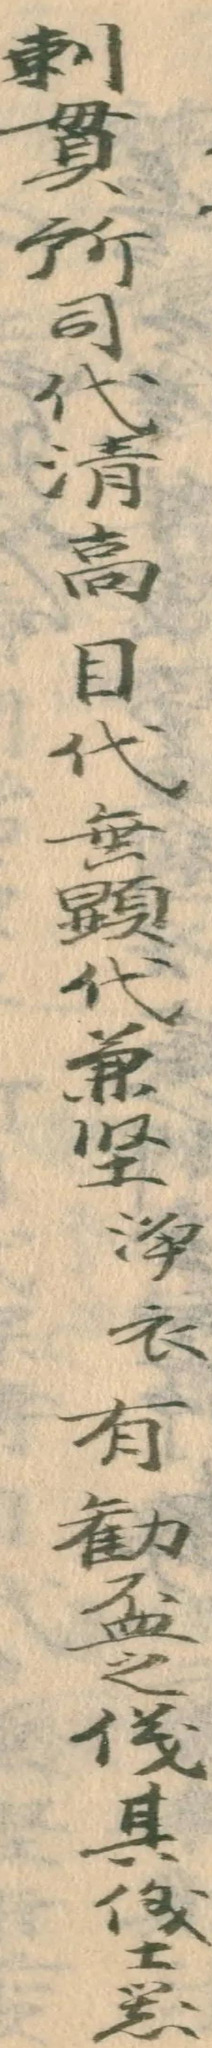刺貫所司代清高目代垂顕代兼堅浄衣有勧盃之儀其儀土器
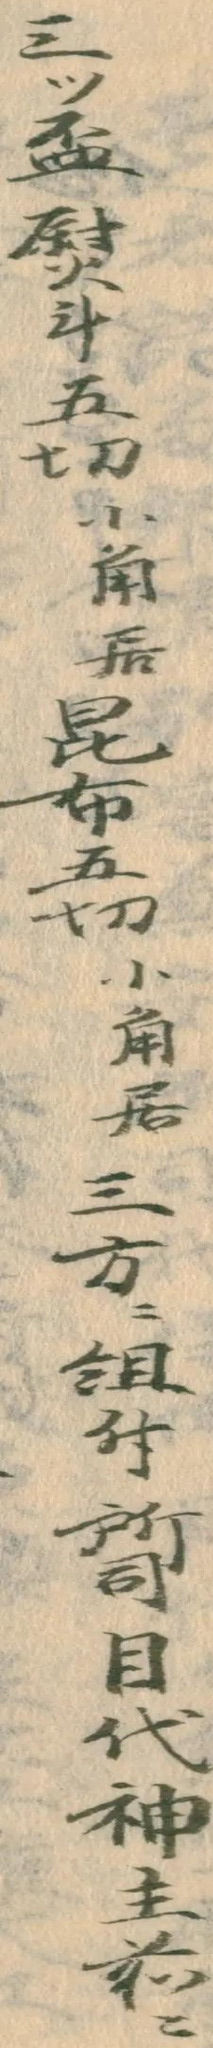三ツ盃熨斗五切小角居昆布五切小角居三方ニ組付所司目代神主前ニ
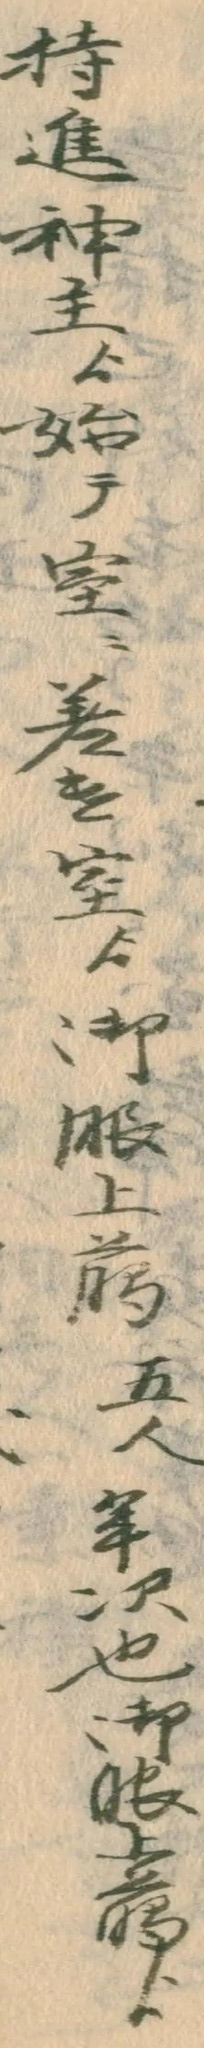持進神主ゟ始テ室ニ差遣室ゟ御服上臈五人年次也御服上臈ゟ
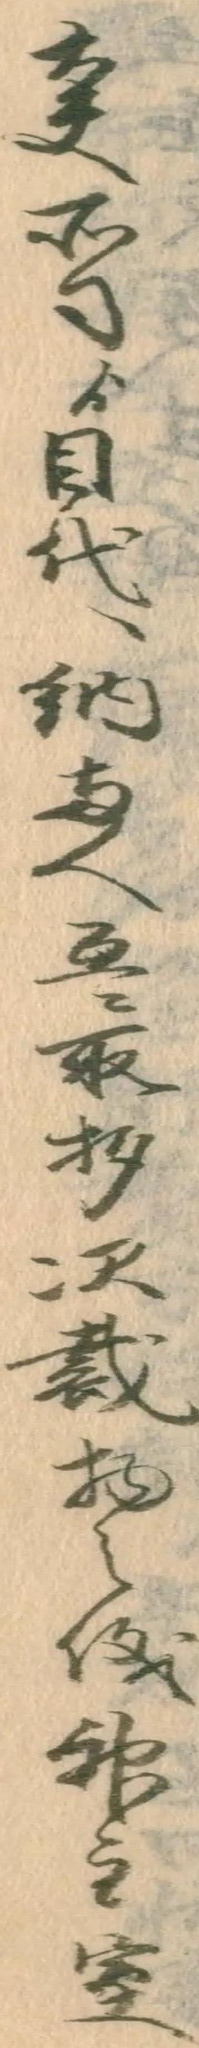大夫所司ゟ目代へ納両人互ニ取扱次裁物之儀神主室
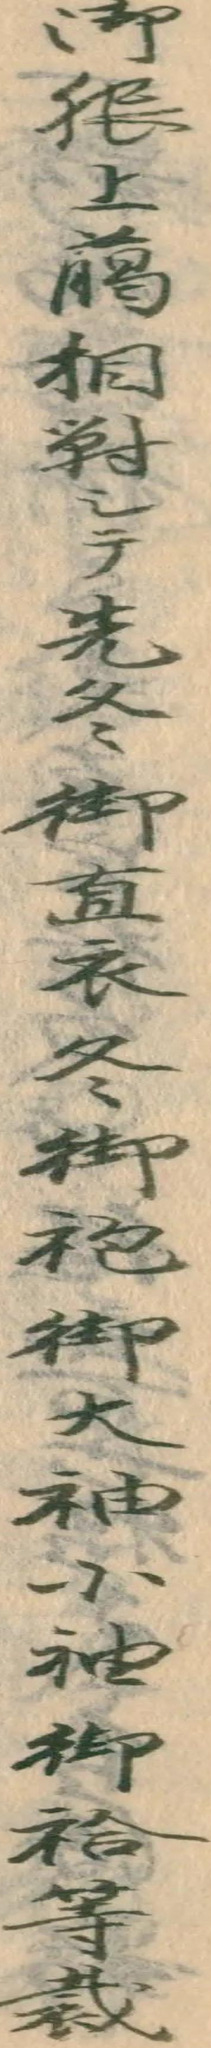御服上臈相対シテ先冬御直衣冬御袍御大袖小袖御袷等裁
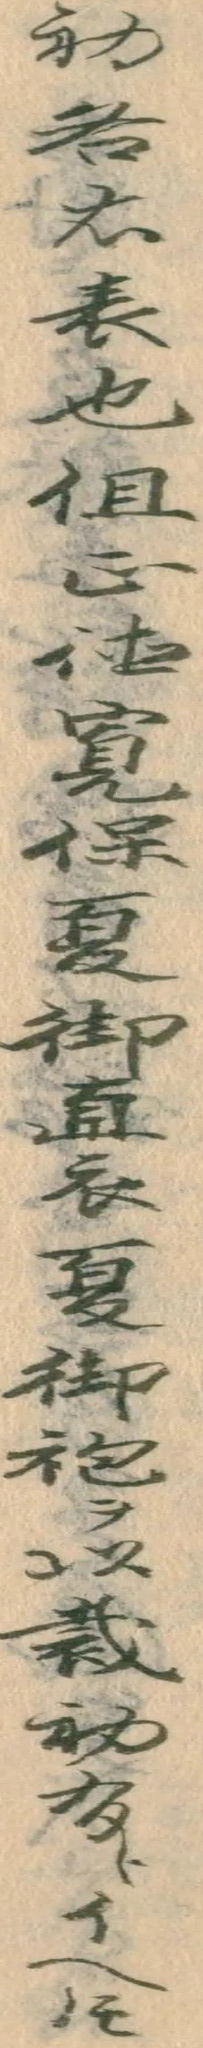初各右表也但正徳寛保夏御直衣夏御袍ヲ以裁初有トイヘトモ
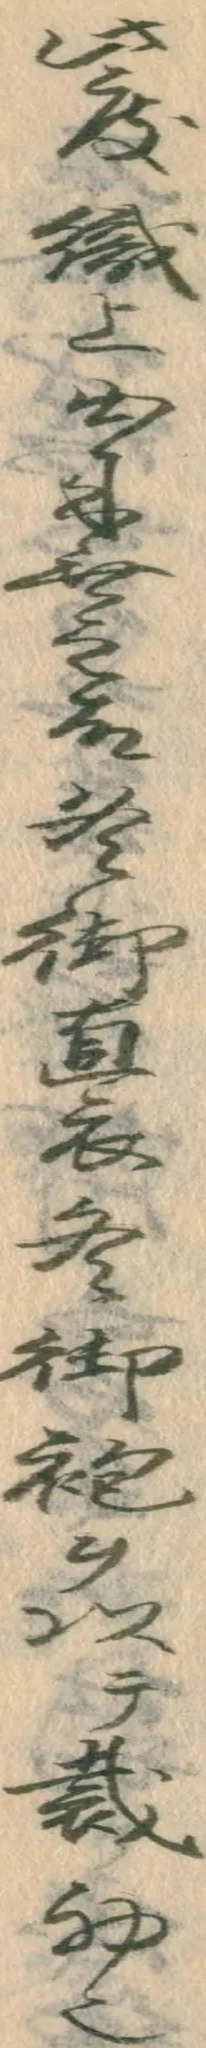此度織上出来無之故冬御直衣冬御袍ヲ以テ裁初也
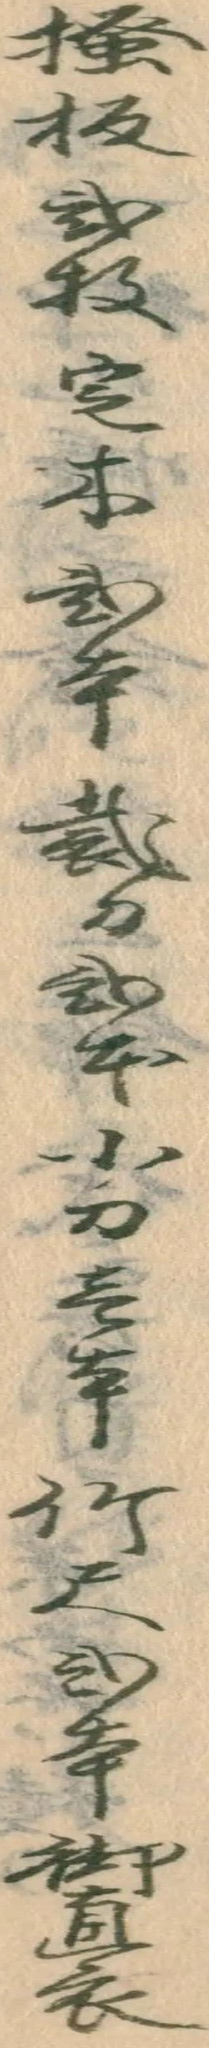掻板弐枚定木弐本裁刀弐本小刀壱本竹尺弐本御直衣
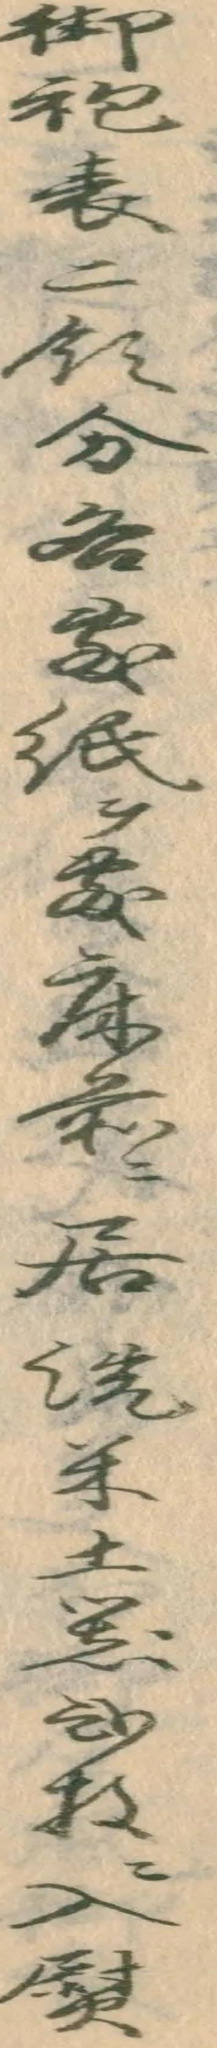御袍表二領分各敷紙ヲ敷床前ニ居洗米土器弐枚ニ入熨
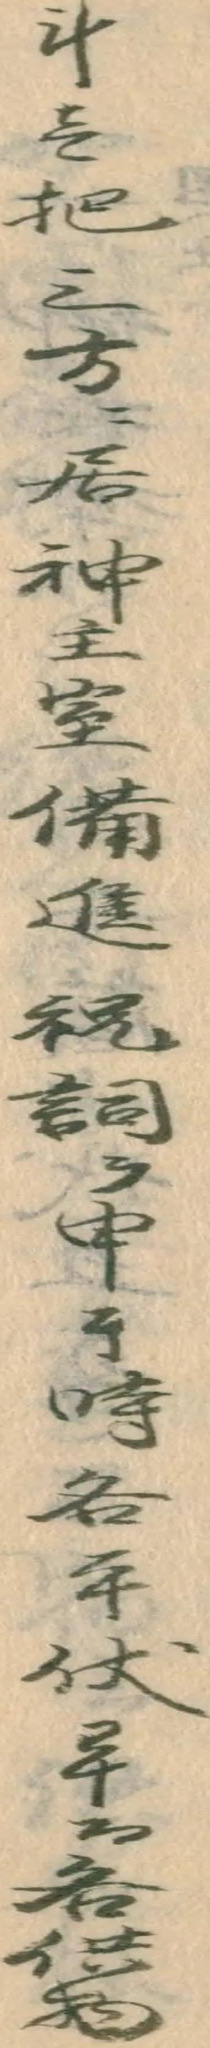斗壱把三方ニ居神主室備進祝詞ヲ申于時各平伏畢而各供物
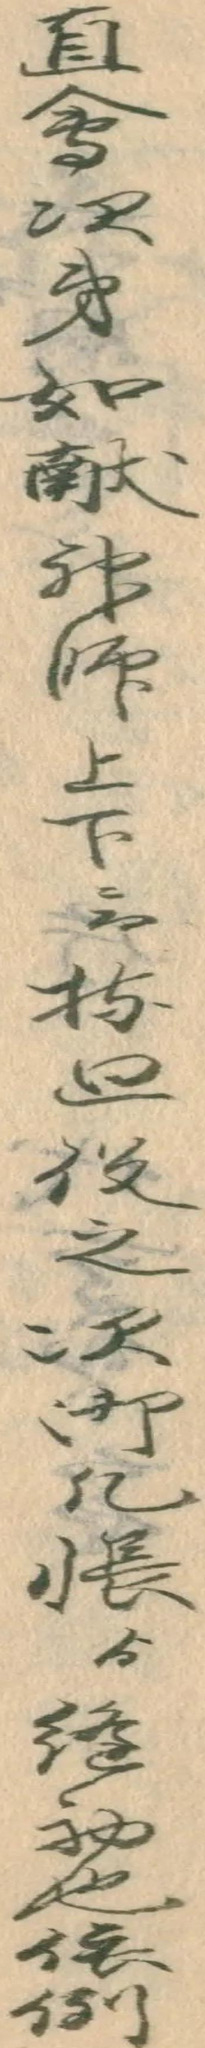直会次第如献神師上下ニ而持廻役之次御几帳ゟ縫初也依例
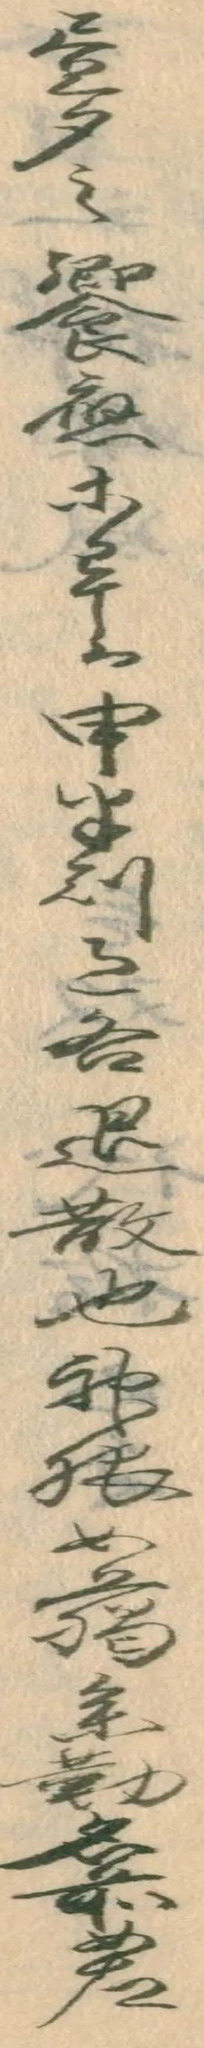昼夕之饗応等畢而申半刻過各退散也神服如臈参勤名所如左
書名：賀茂社記録. 第17冊
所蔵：国立国会図書館 National Diet Library, JAPAN
